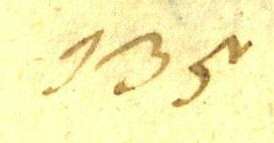135
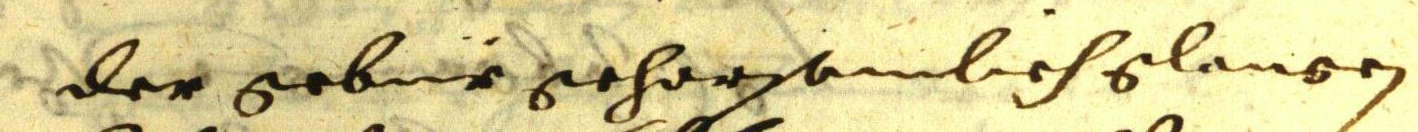der gebür gehorsamlich glangen
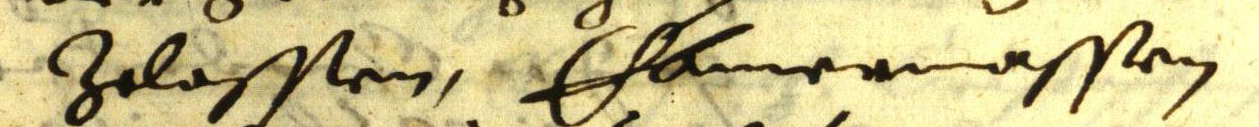Zelassen, Ebmermassen
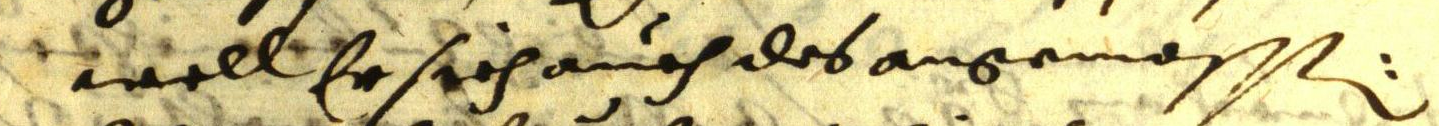well Er sich aūch des angemasst¬
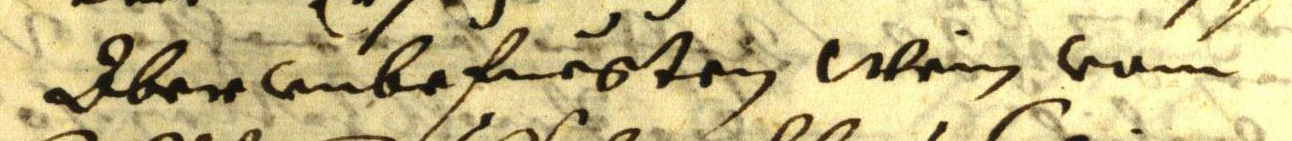Aber vnbefūegten Wein vom
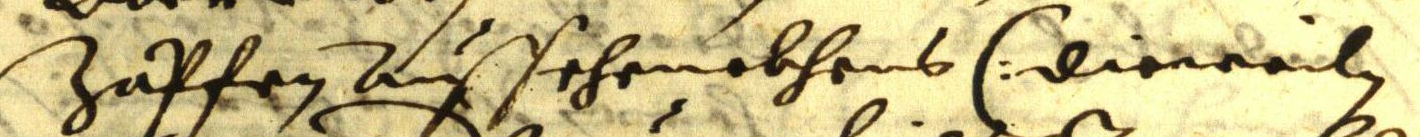ZaPfen Aūsschenckhens (:dieweiln
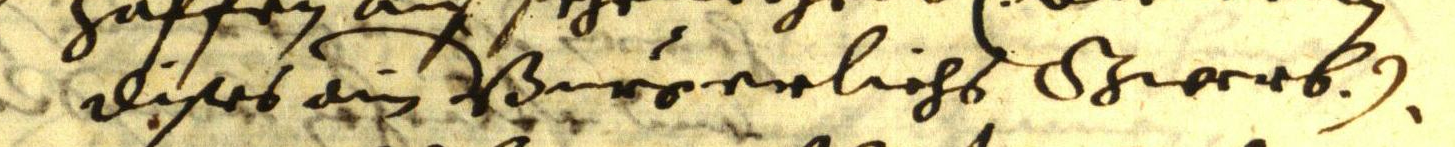dises ain Būrgeerlichs Gwerb.).
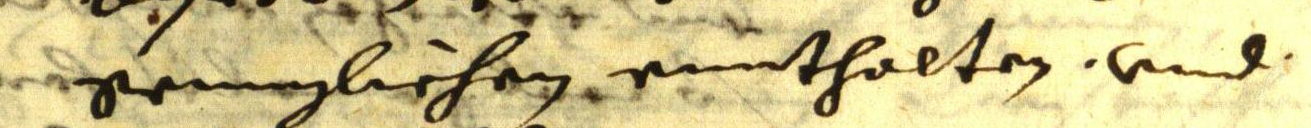gennzlichen ennthalten. vnd
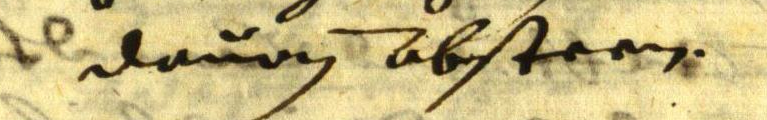daūon Absteen.
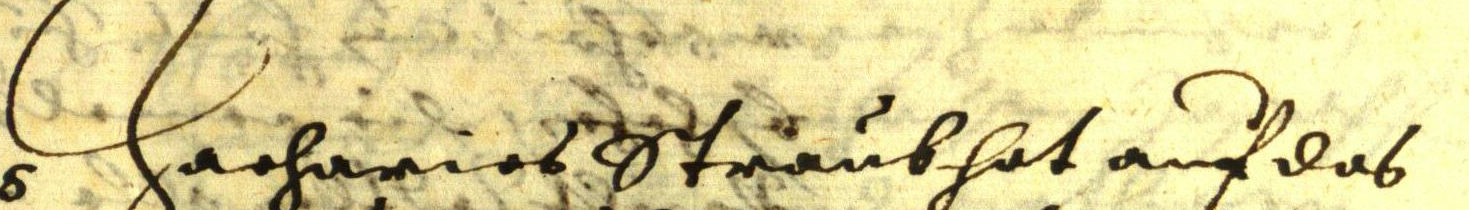Zacharias Straūb hat aūf das
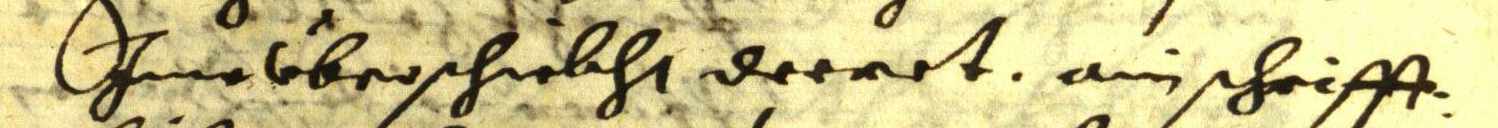Ime v̄berschickht decret. ain schrifft¬
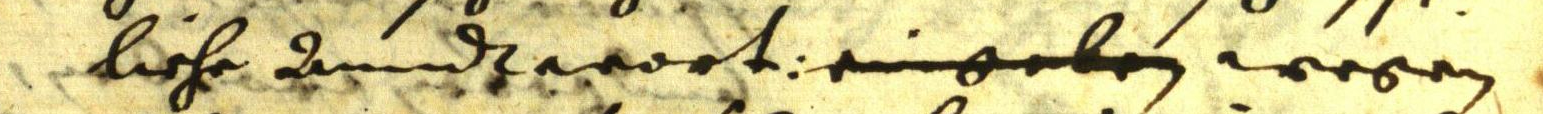liche Anndtwort: eingeben wegen
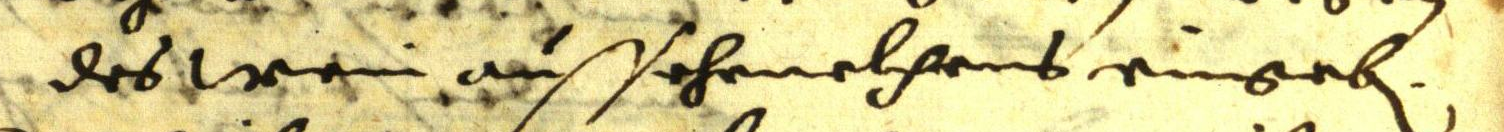des wein aūsschenckhens eingeb.
